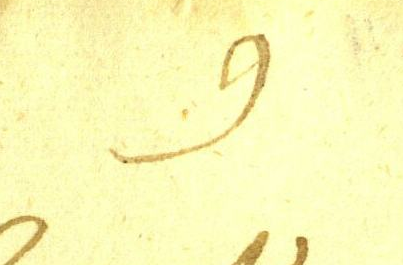9
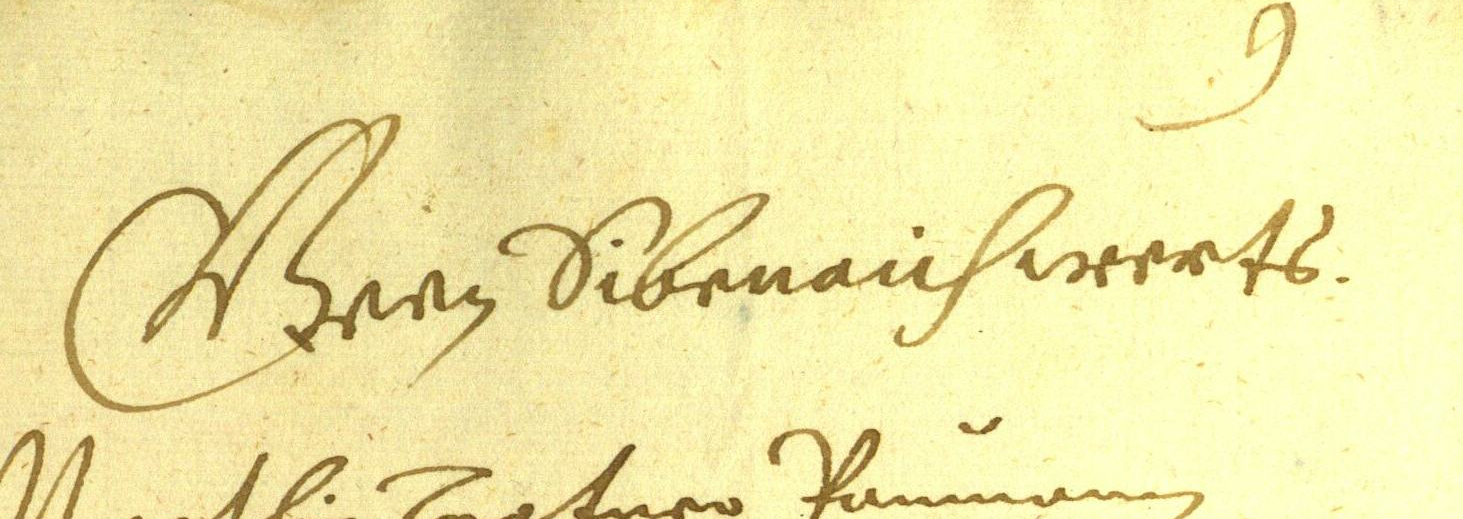Geen Sibenaich werts.
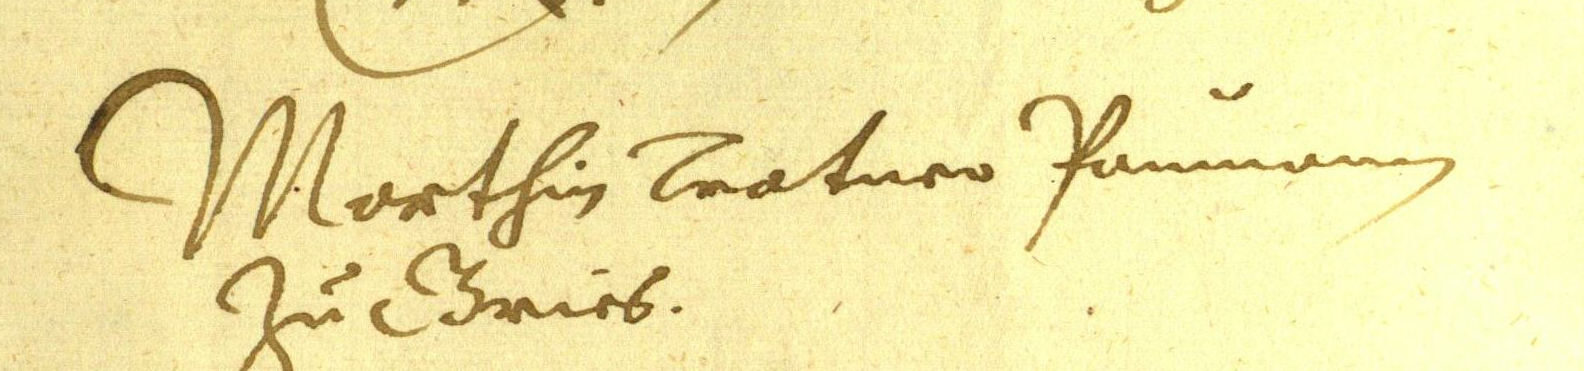Marthin Tratner Paūmann
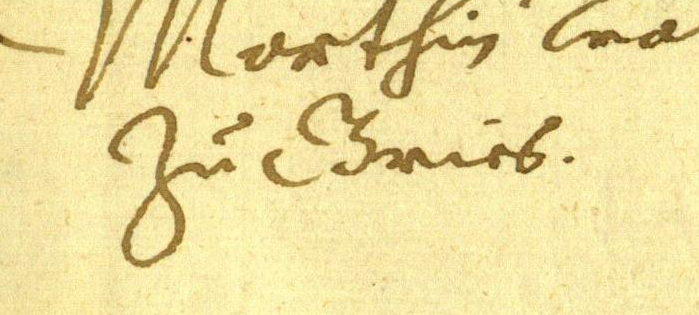Zū Gries.
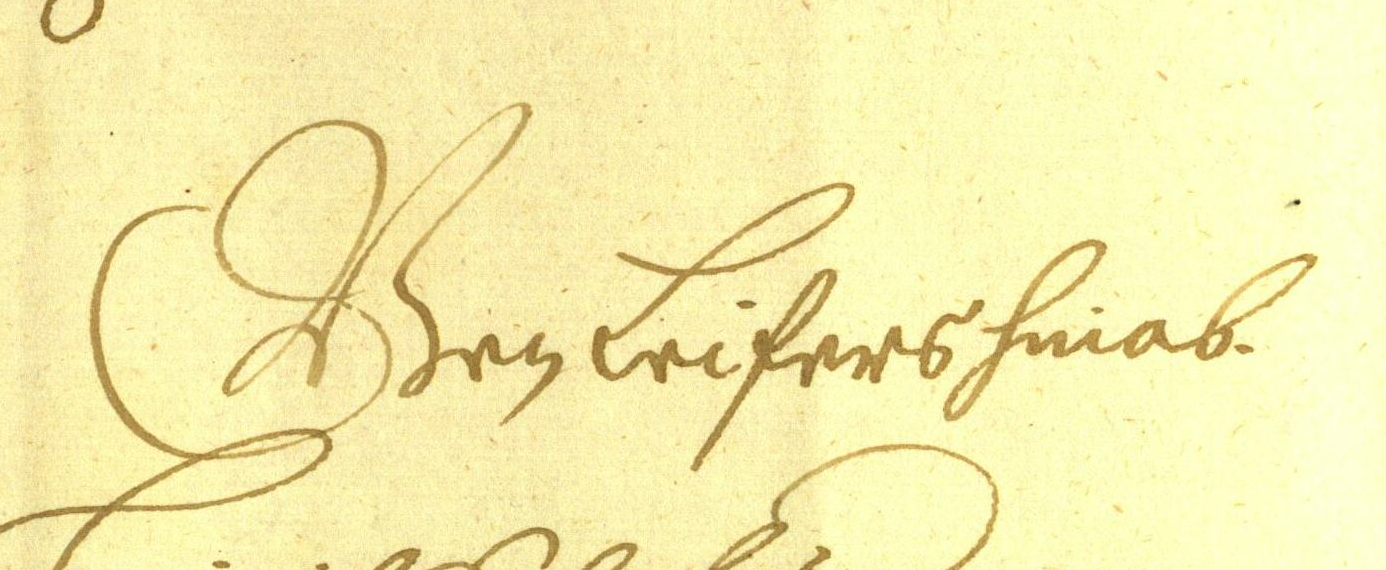Gen Leifers hinab.
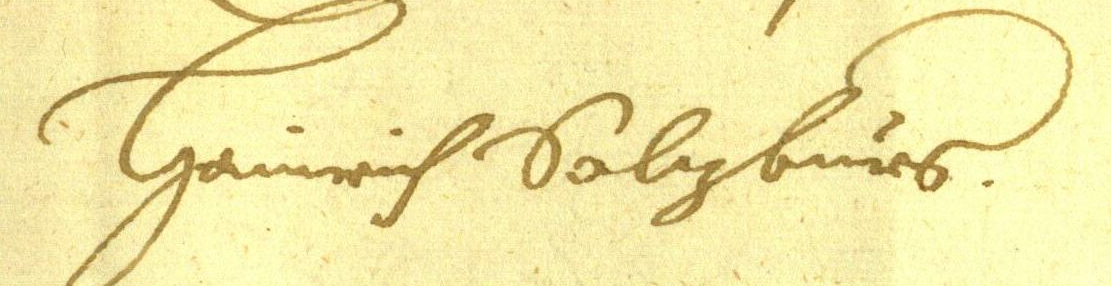Hainrich Salzbūrg.
